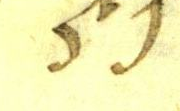51
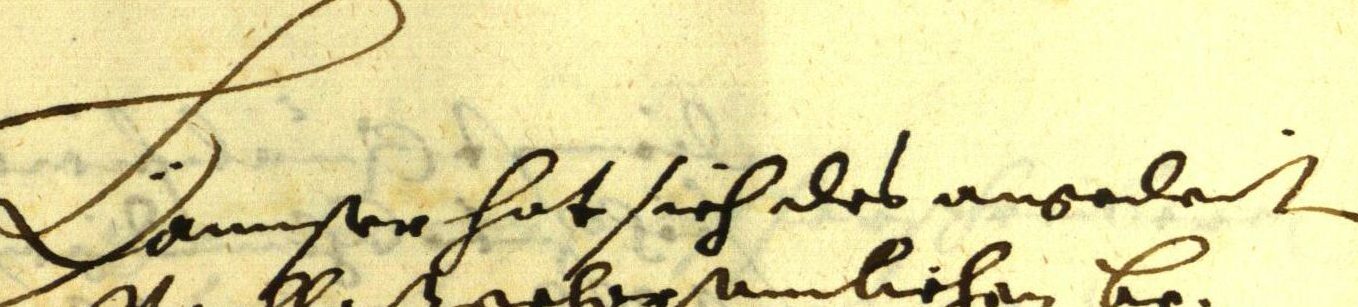Lännser hat sich des angedeit
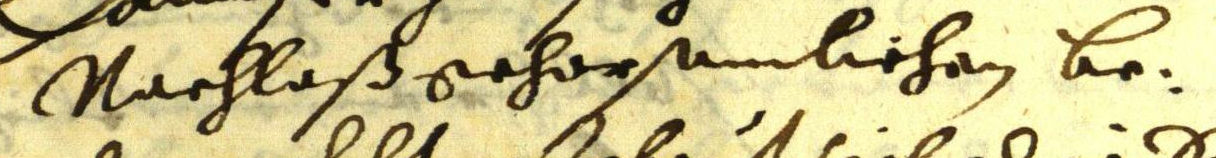Nachlaß gehorsamlichen be¬
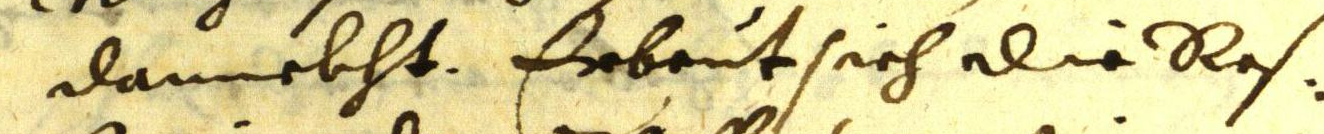dannckht. Erbeūt sich die Res¬
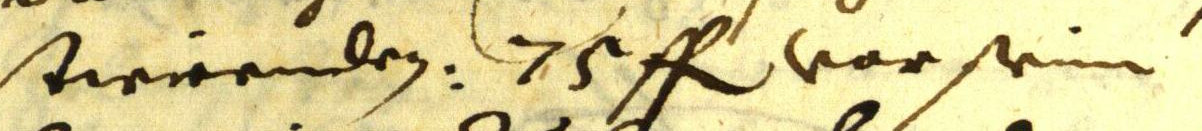stierenden: 75 fl vor seiner
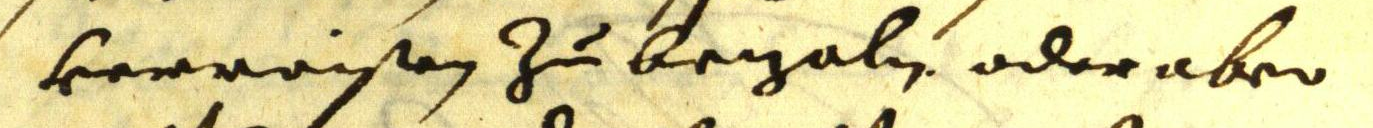verraisen Zū bezaln. oder aber
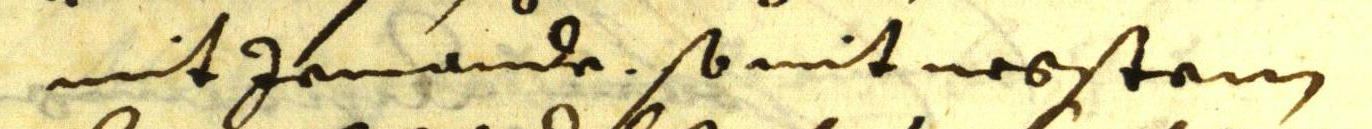mit Jemande. so mit negstem
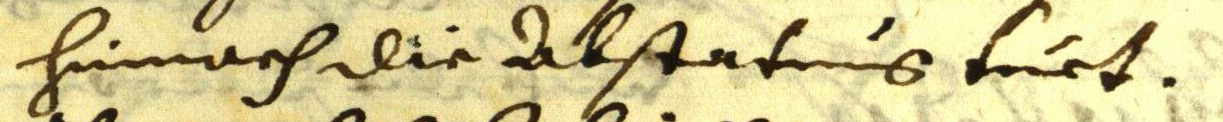hinach die Abstatūng tūet.
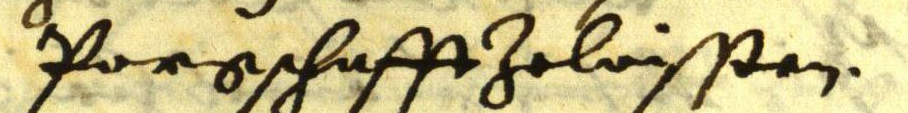Porgschafft Zelaissten.
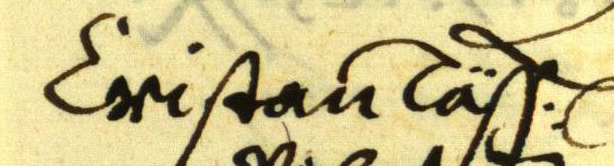Cristan Täss¬
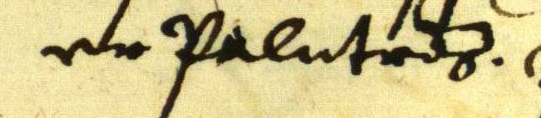er Palntrag.
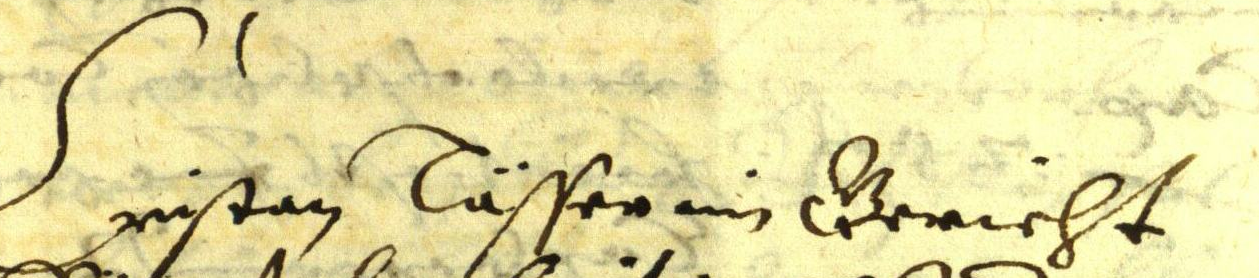Cristan Tässer im Gericht
